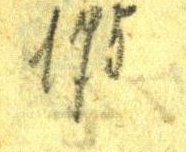175
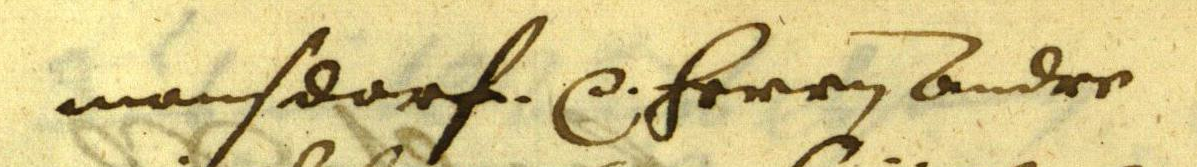mansdorf. etc. herrn Andre
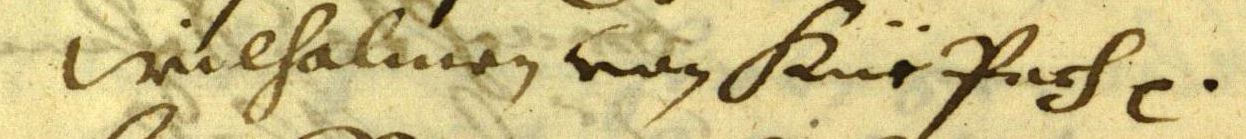Wilhalmen von KüePach etc.
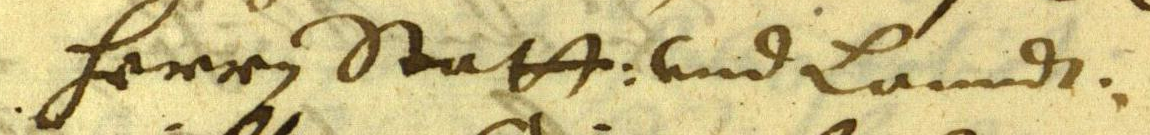herrn Statt: vnd Lanndt¬
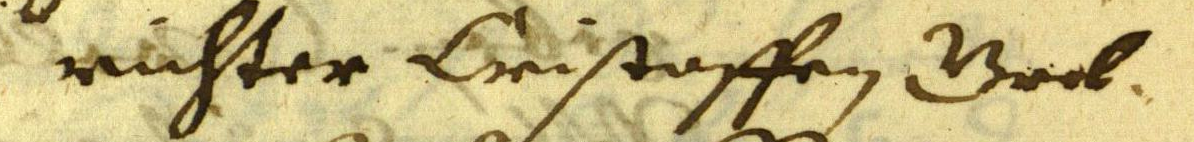richter Cristoffen Greb¬
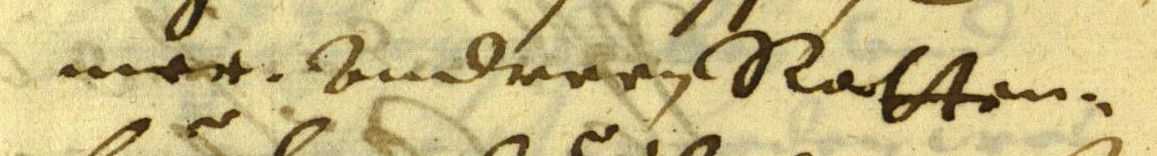mer. Andreen Rotten¬
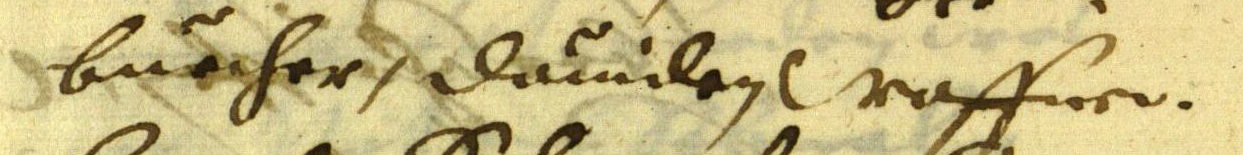būecher, Daūiden Waffner.
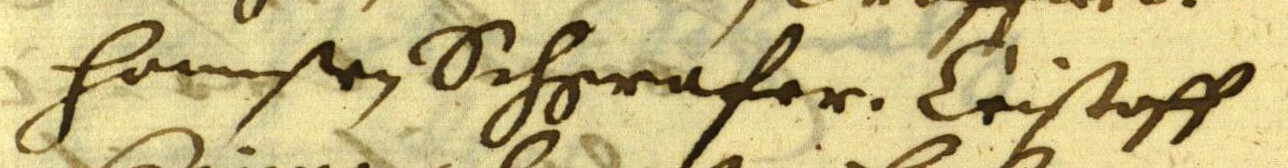hannsen Schgrafer. Cristoff
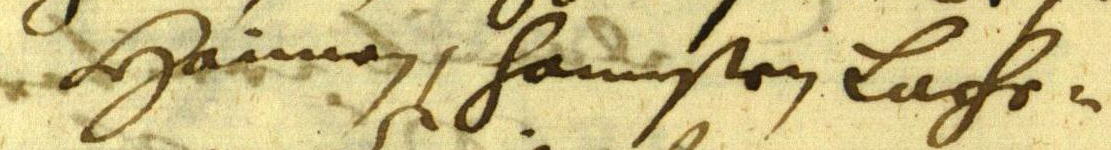Haimen, hannsen Loche¬
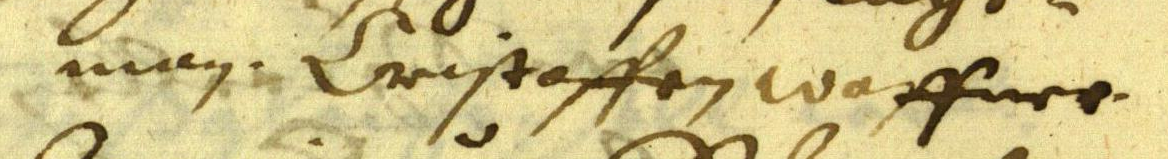man. Cristoffen Waffner.
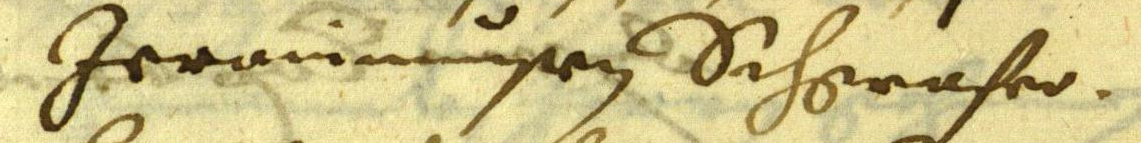Jeronimūsen Schgrafer.
